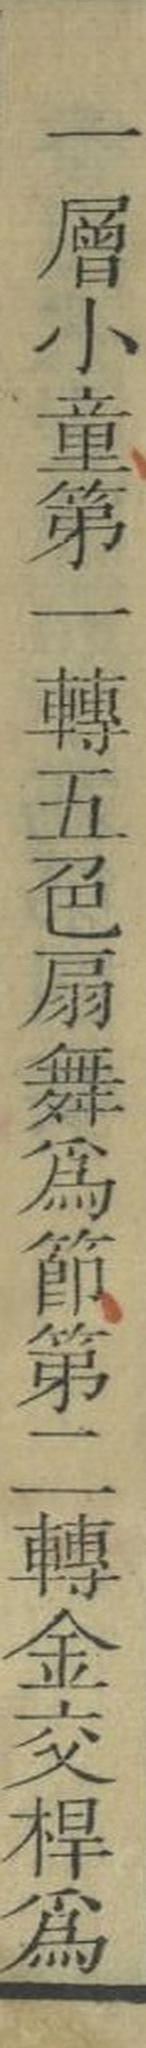一層小童第一轉五色扇舞爲節第二轉金交桿爲
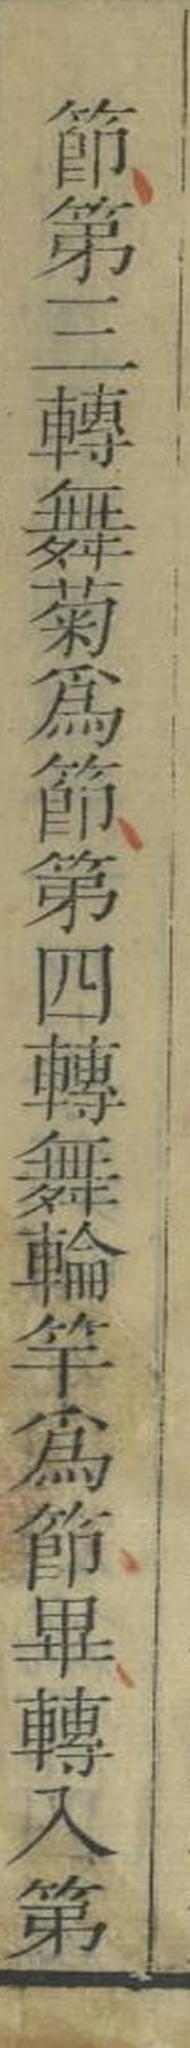節第三轉舞菊爲節第四轉舞輪竿爲節畢轉入第

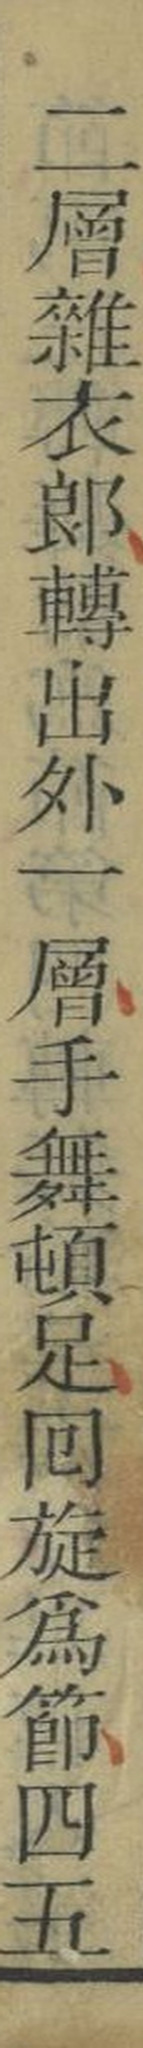二層雜衣郎轉出外一層手舞頓足囘旋爲節四五
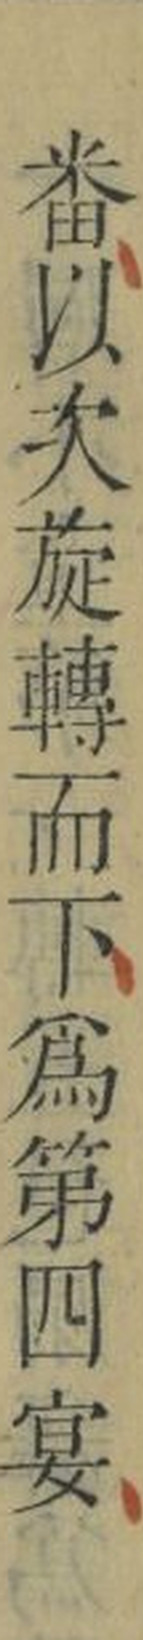畨以次旋轉而下爲第四宴
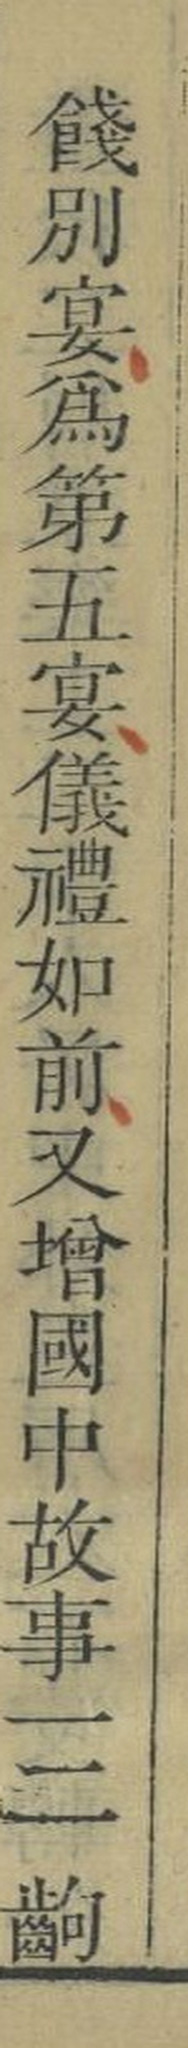餞別宴爲第五宴儀禮如前又增國中故事一二齣
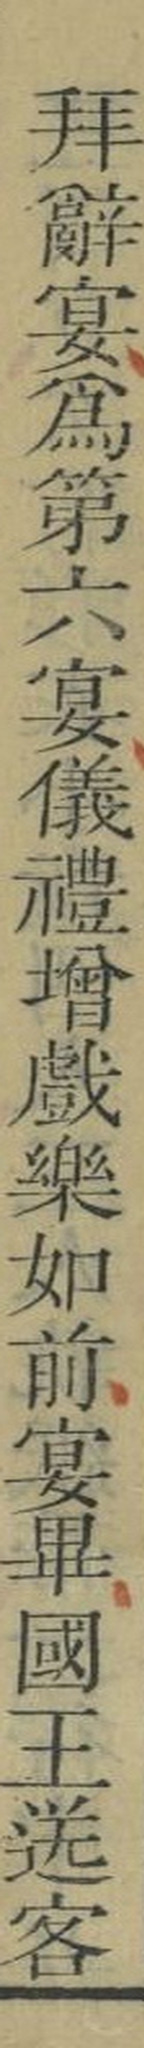拜辭宴爲第六宴儀禮增戲樂如前宴畢國王送客
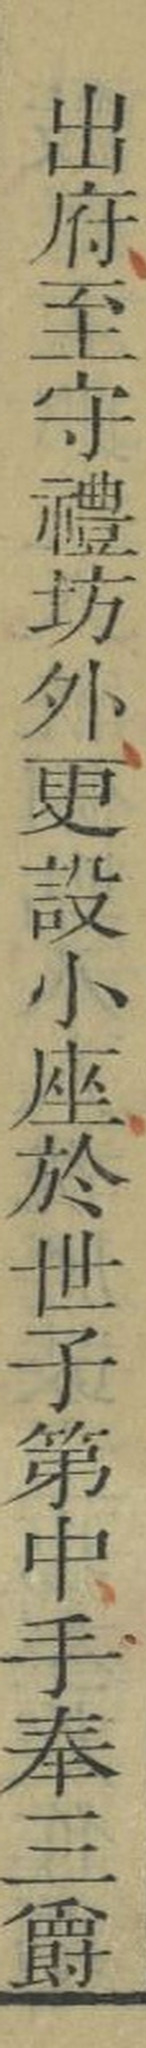出府至守禮坊外更設小座於世子第中手奉三爵
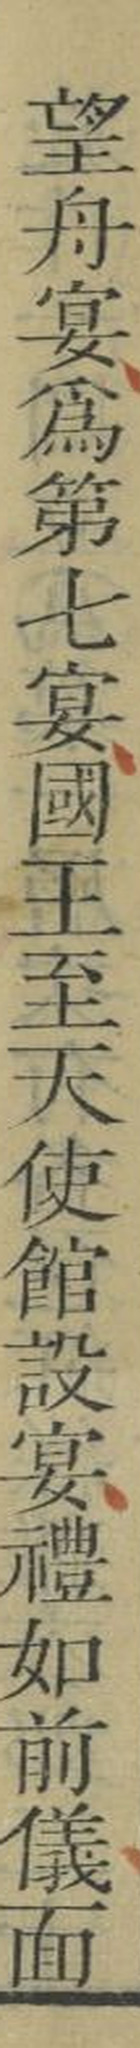望舟宴爲第七宴國王至天使館設宴禮如前儀面
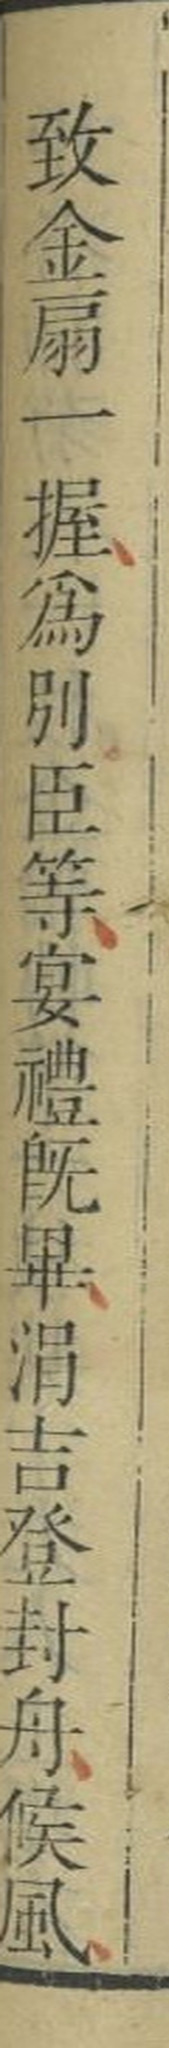致金扇一握爲別臣等宴禮既畢涓吉登封舟候風
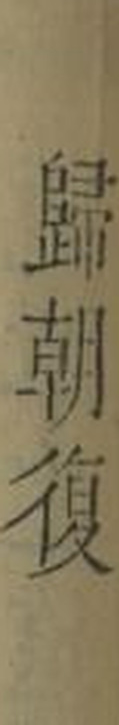歸朝復
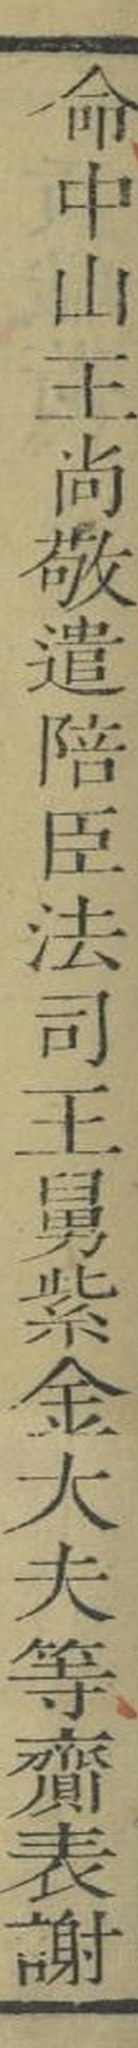命中山王尚敬遣陪臣法司王舅紫金大夫等齎表謝
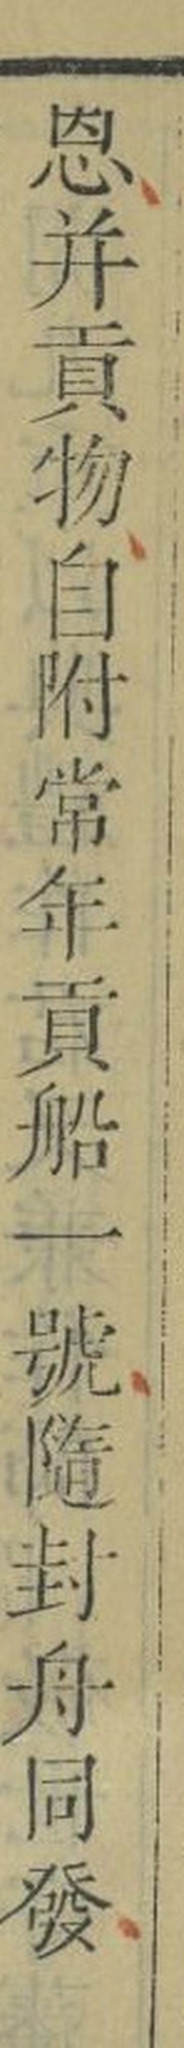恩并貢物自附常年貢船一號隨封舟同發
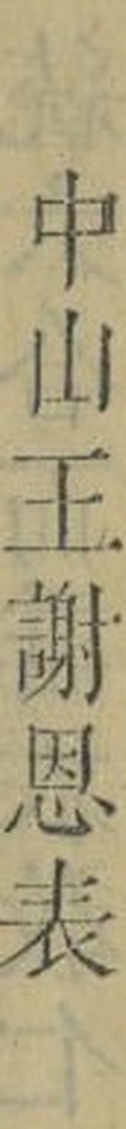中山王謝恩表
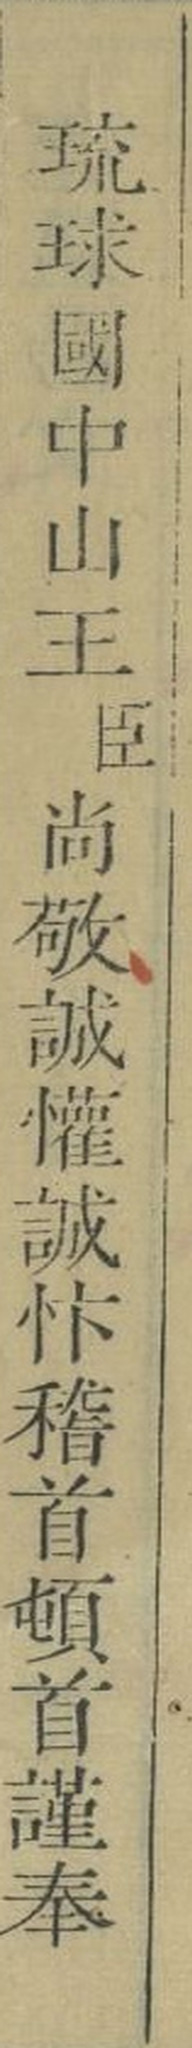琉球國中山王臣尚敬誠懽誠忭稽首頓首謹奉
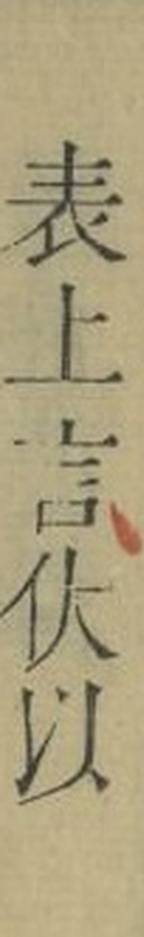表上言伏以
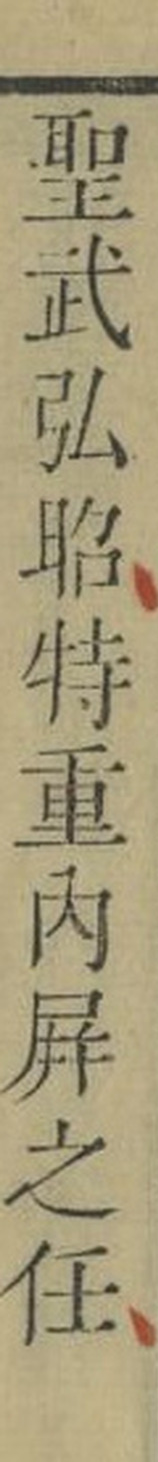聖武弘昭特重内屛之任
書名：中山伝信録 巻一、巻二
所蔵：University of the Ryukyus Library
